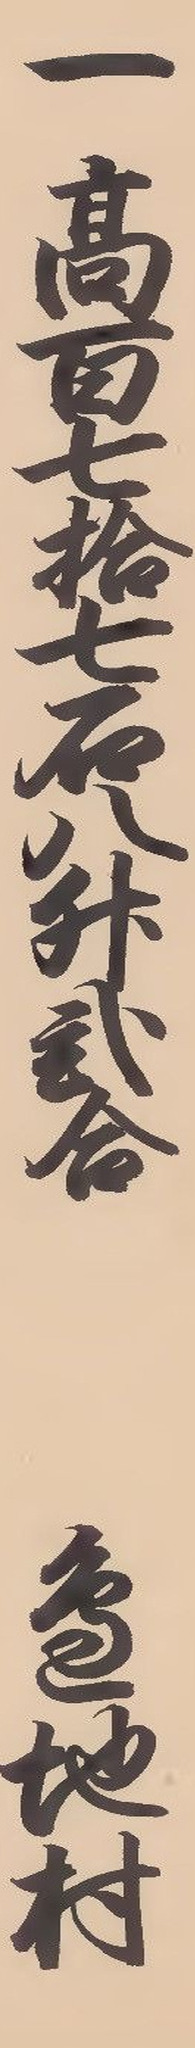一高百七拾七石八升弐合辺地村
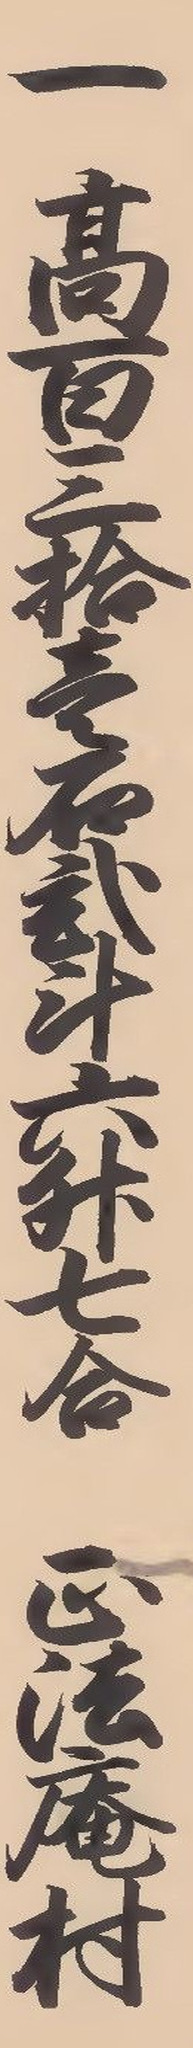一高百三拾壱石弐斗六升七合正法庵村
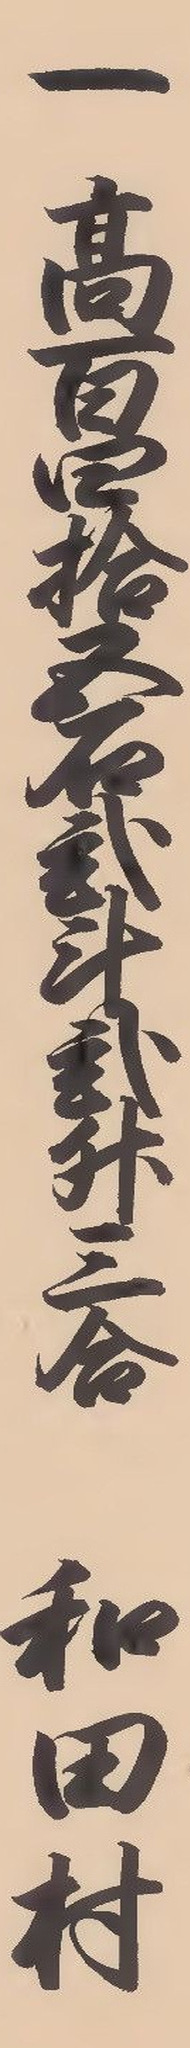一高百四拾五石弐斗弐升三合和田村
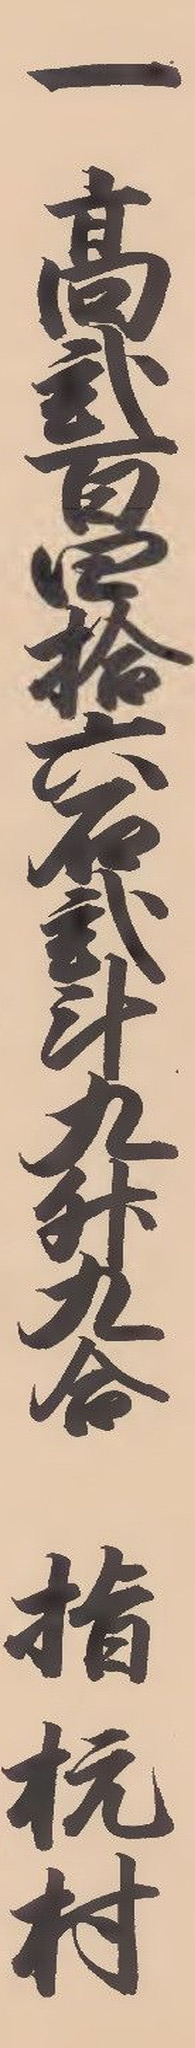一高弐百四拾六石弐斗九升九合指杬村
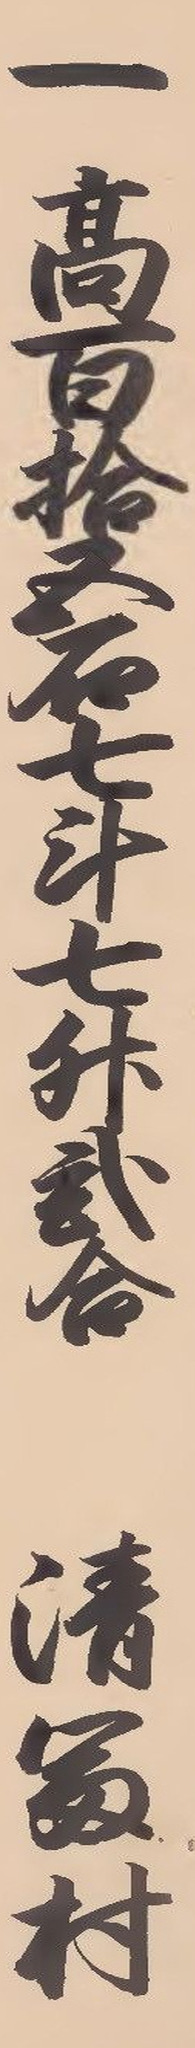一高百拾五石七斗七升弐合清冨村
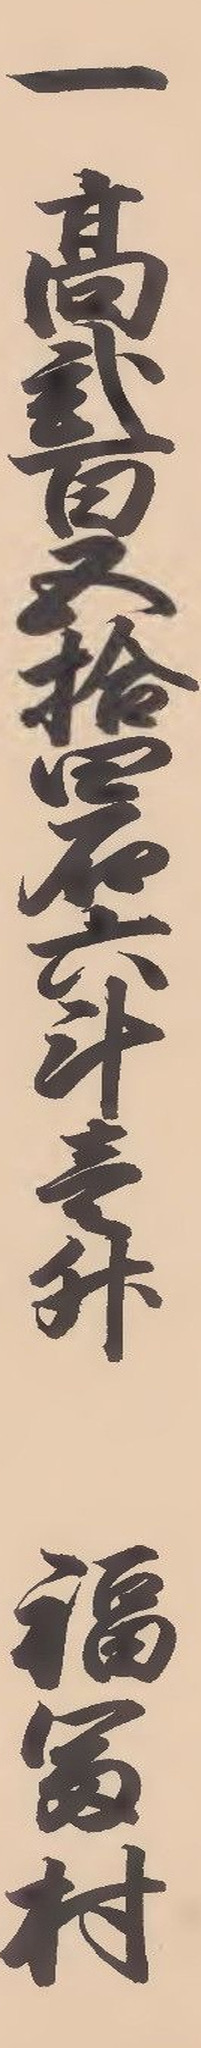一高弐百五拾四石六斗壱升福冨村
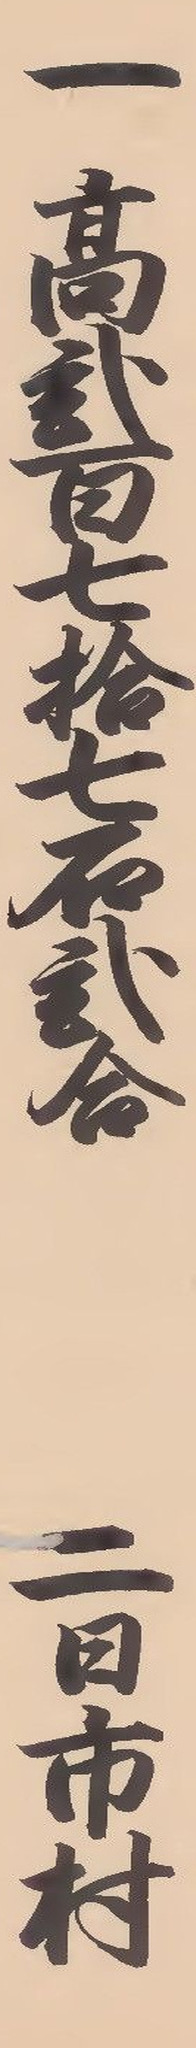一高弐百七拾七石弐合二日市村
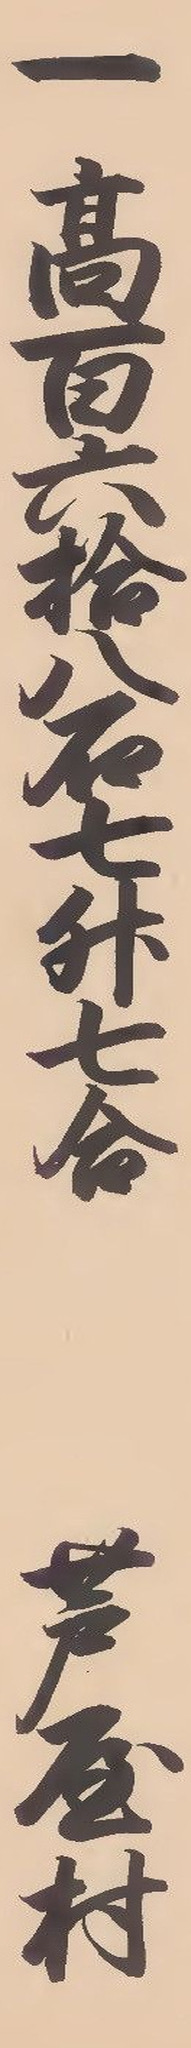一高百六拾八石七升七合芦屋村

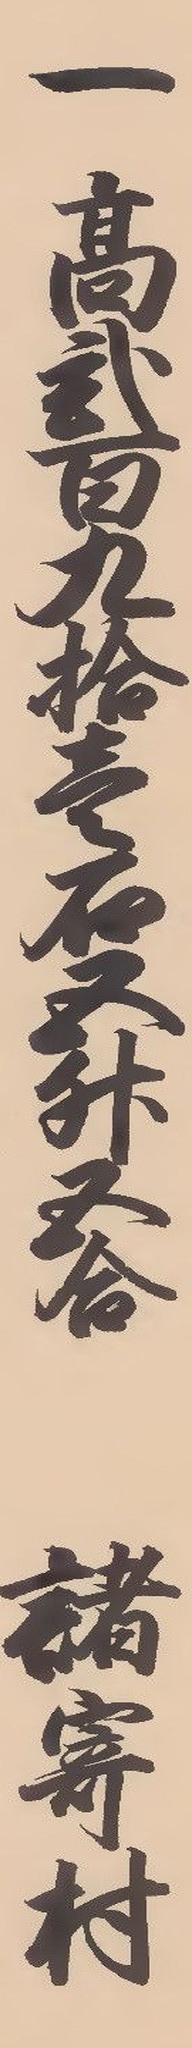一高弐百九拾壱石五升五合諸寄村
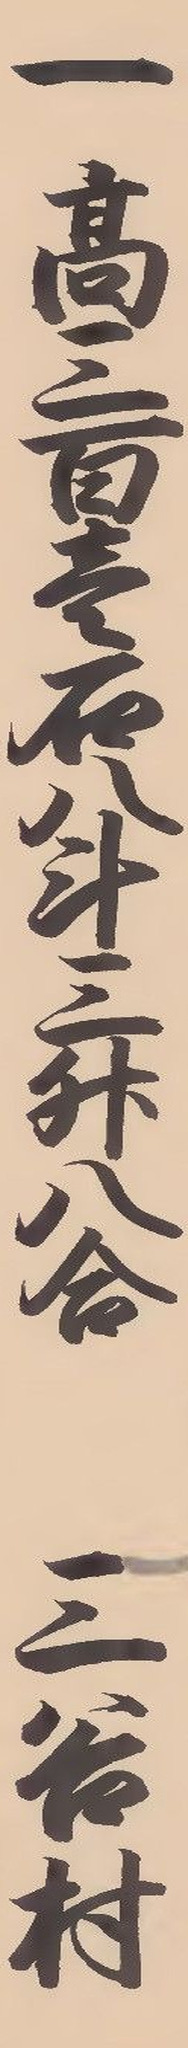一高三百壱石八斗三升八合三谷村
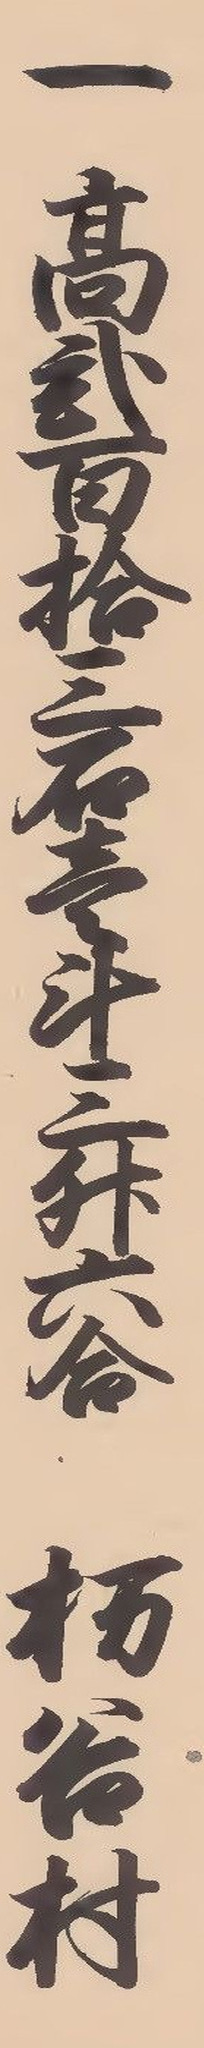一高弐百拾三石壱斗三升六合杤谷村
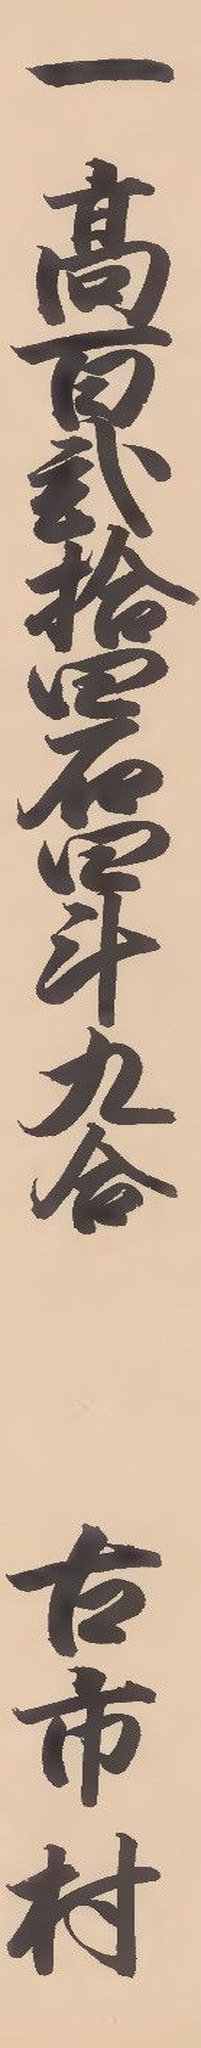一高百弐拾四石四斗九合古市村
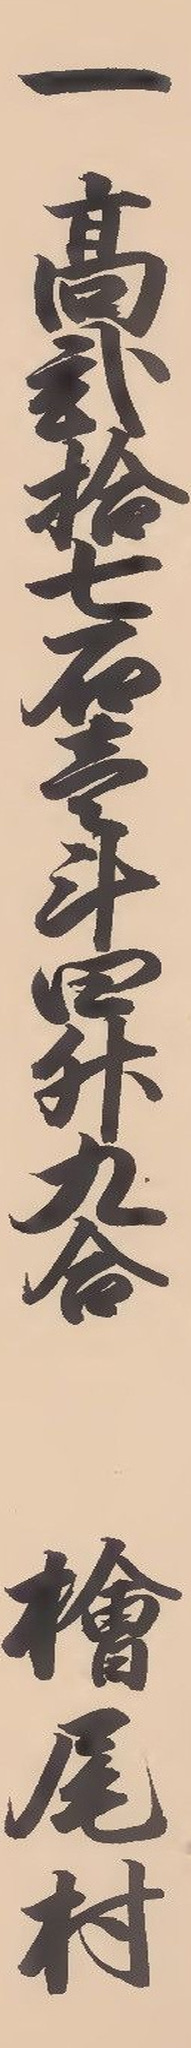一高弐拾七石壱斗四升九合檜尾村
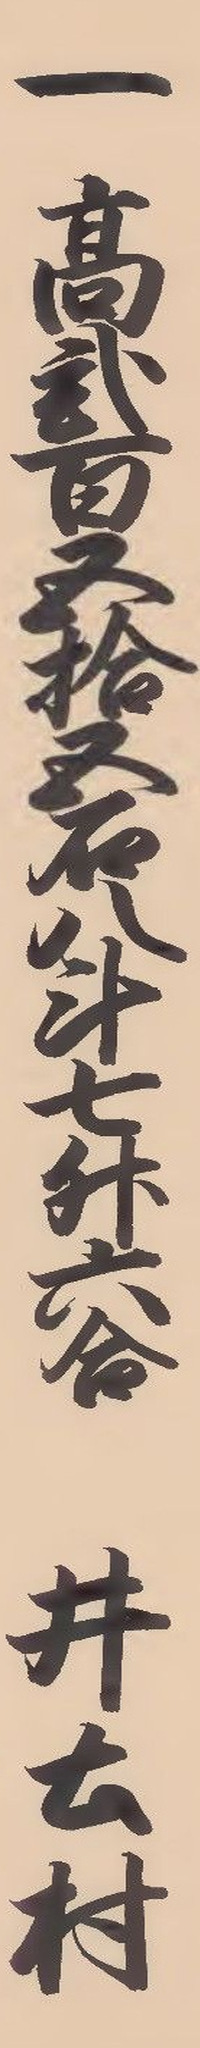一高弐百五拾五石八斗七升六合井土村
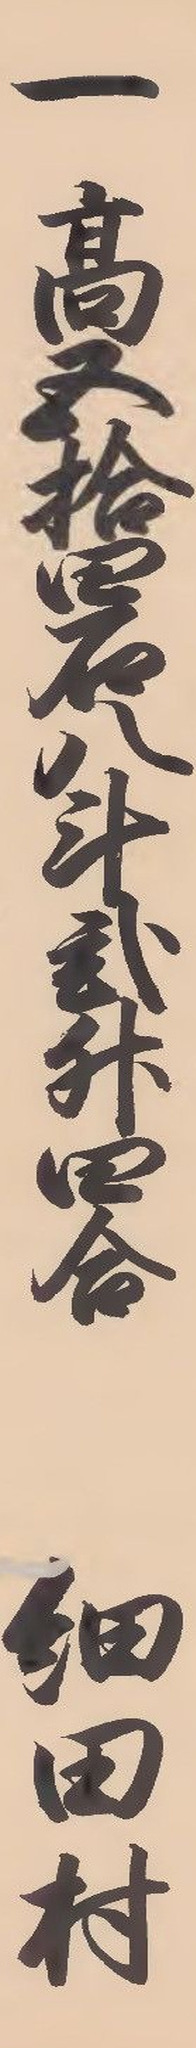一高五拾四石八斗弐升四合細田村
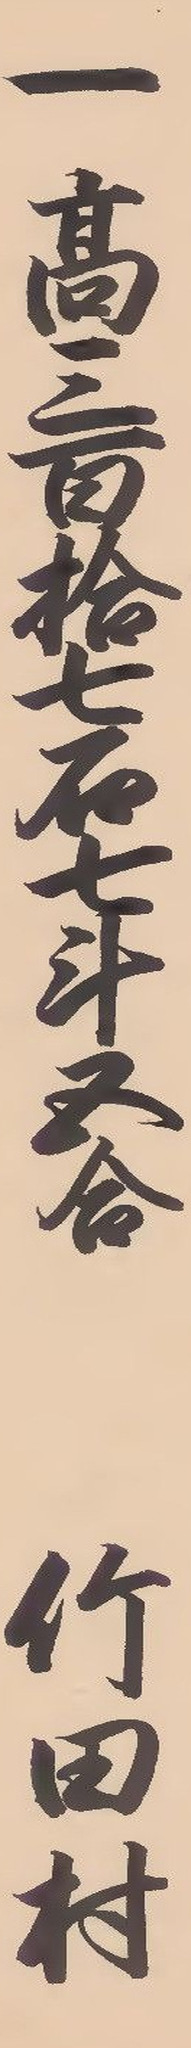一高三百拾七石七斗五合竹田村
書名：但馬国郷帳
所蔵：国立公文書館 National Archives of Japan
